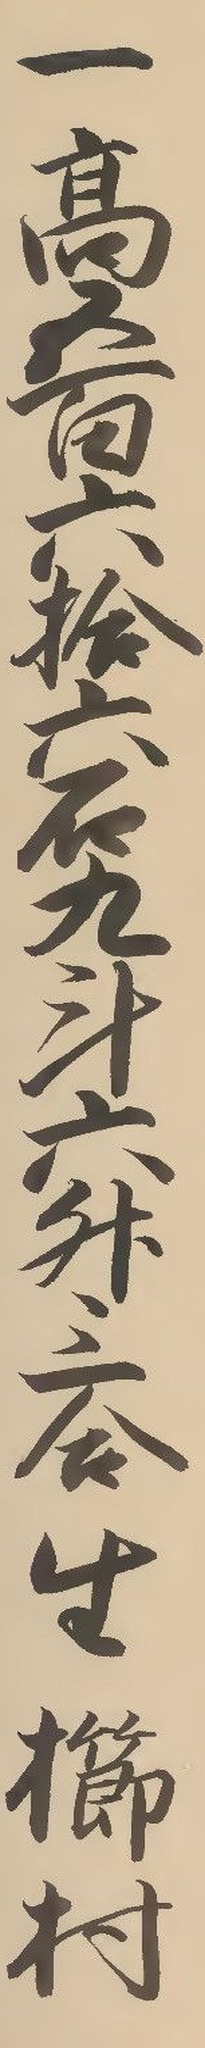一高五百六拾六石九斗六升三合生櫛村
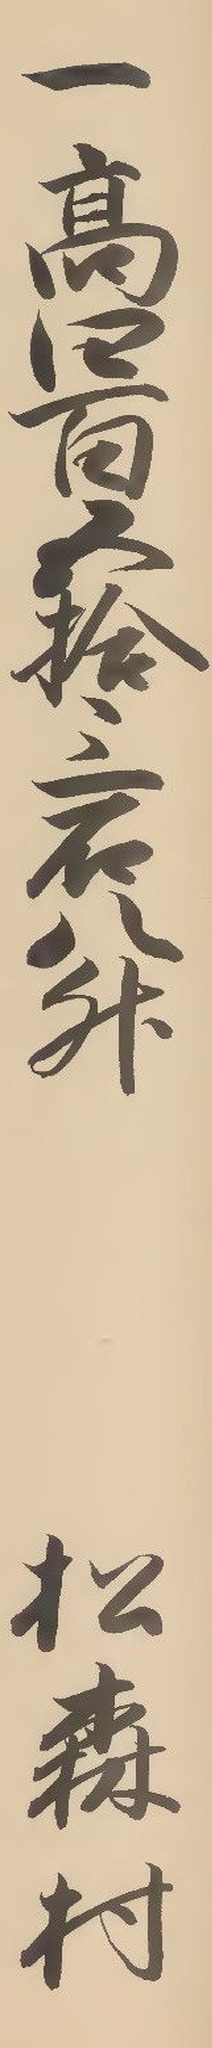一高四百五拾三石八升松森村
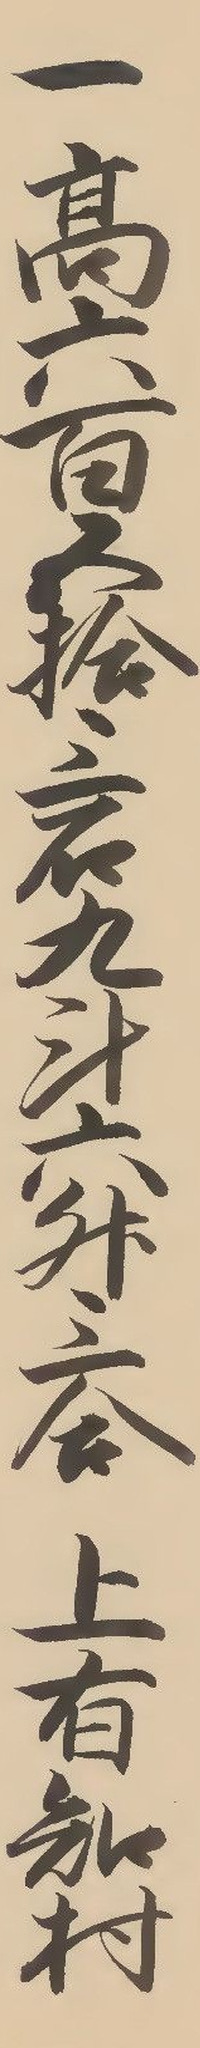一高六百五拾三石九斗六升三合上有知村
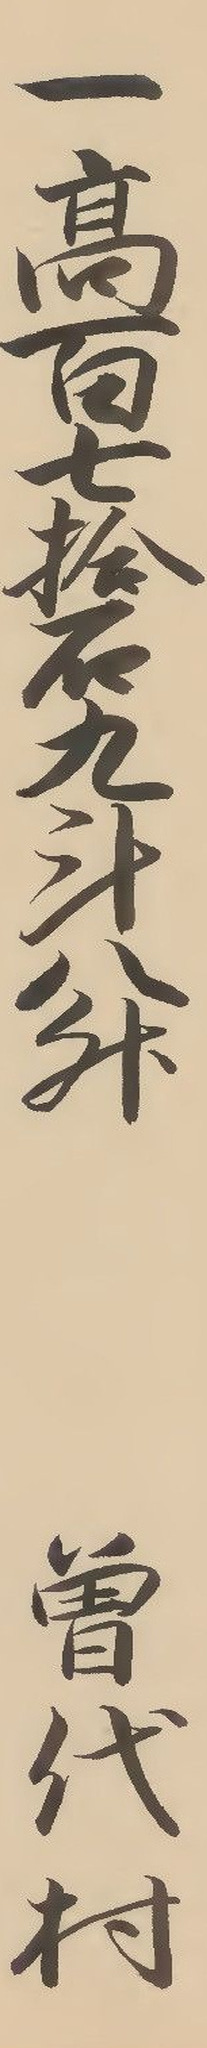一高百七拾石九斗八升曽代村
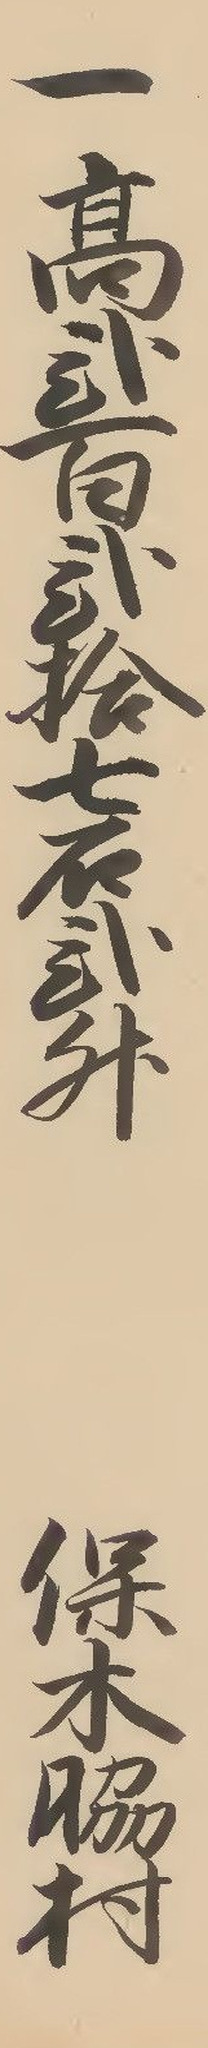一高弐百弐拾七石弐升保木脇村

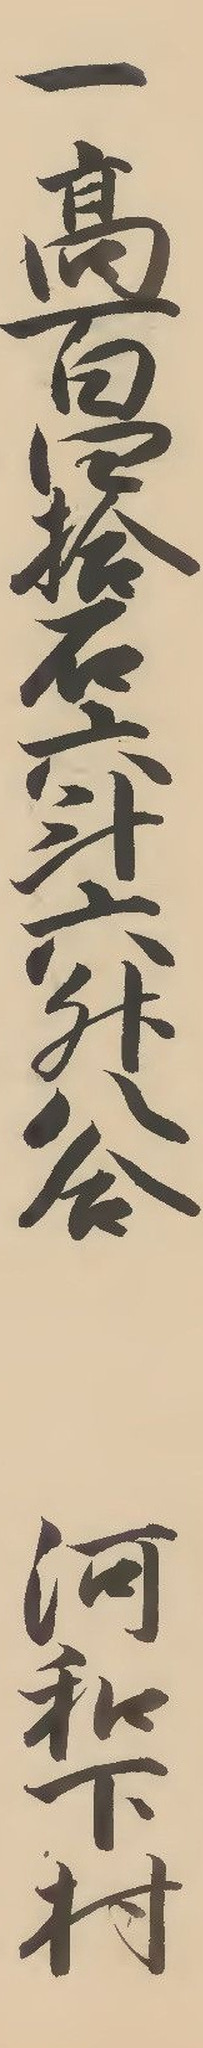一高百四拾石六斗六升八合河和下村
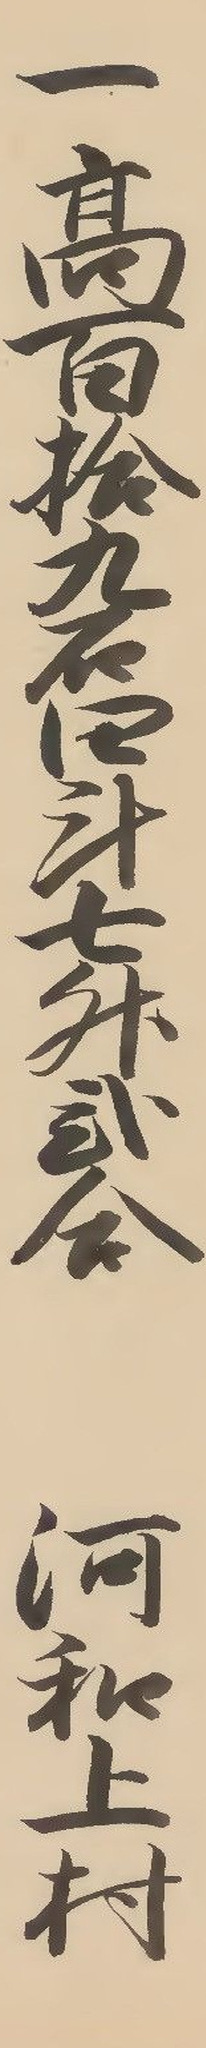一高百拾九石四斗七升弐合河和上村
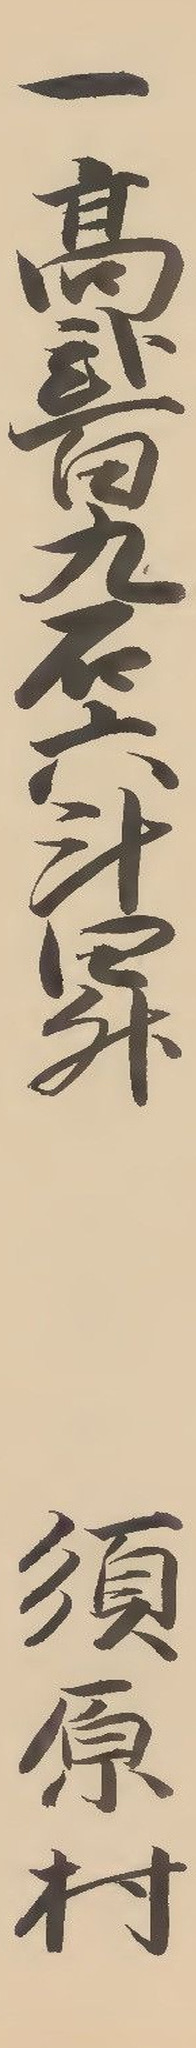一高弐百九石六斗四升須原村
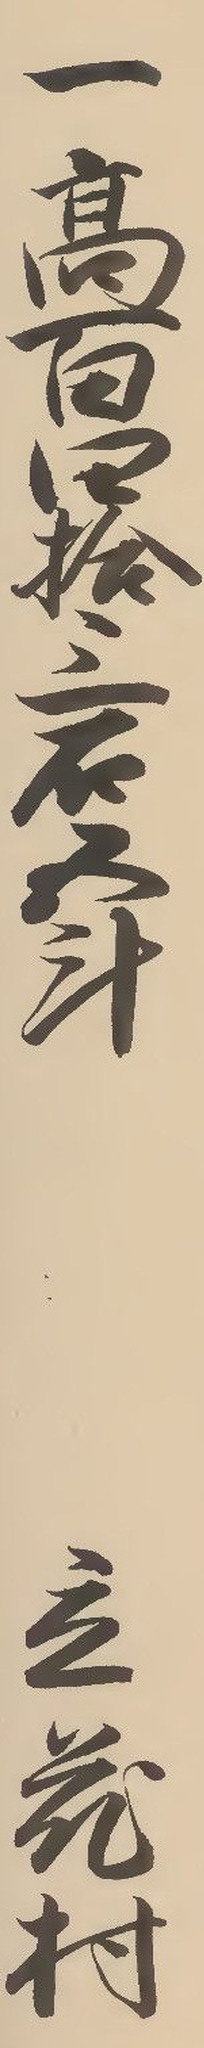一高百四拾三石五斗立花村
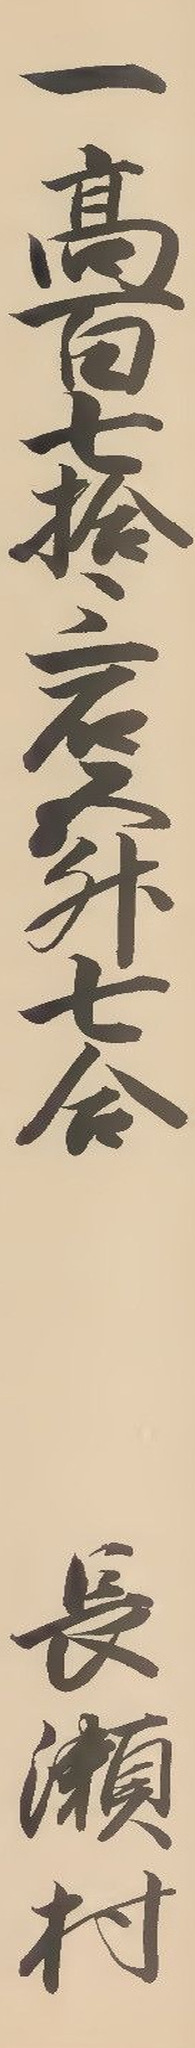一高百七拾三石五升七合長瀬村
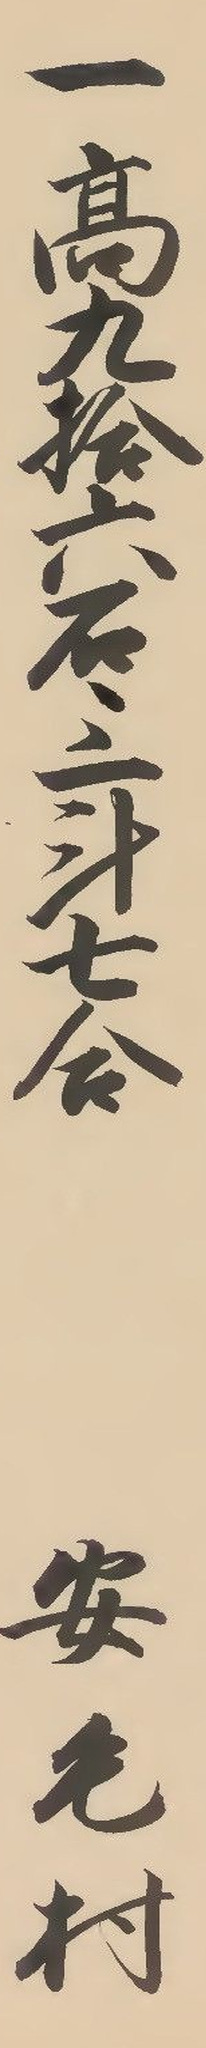一高九拾六石三斗七合安毛村
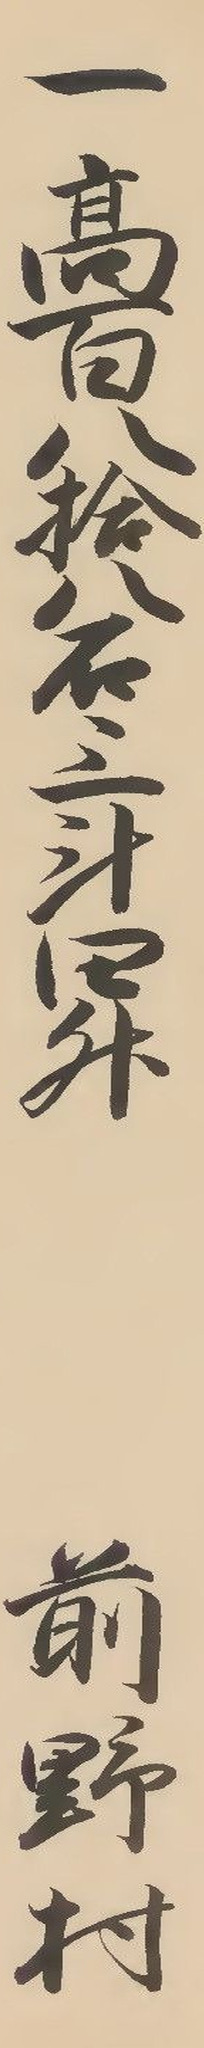一高百八拾八石三斗四升前野村

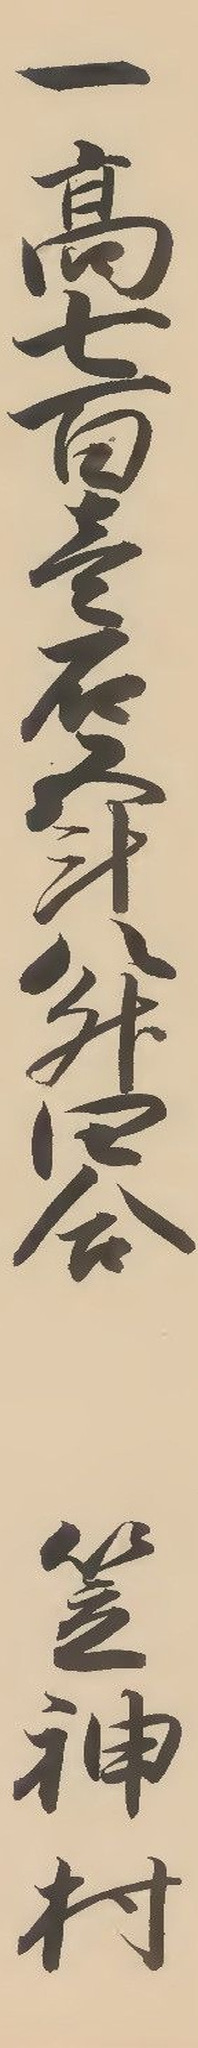一高七百壱石五斗八升四合笠神村
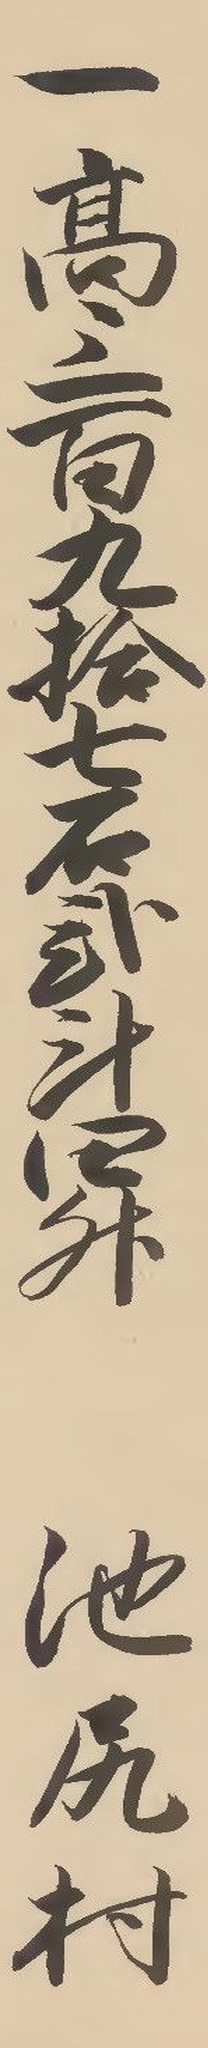一高三百九拾七石弐斗四升池尻村
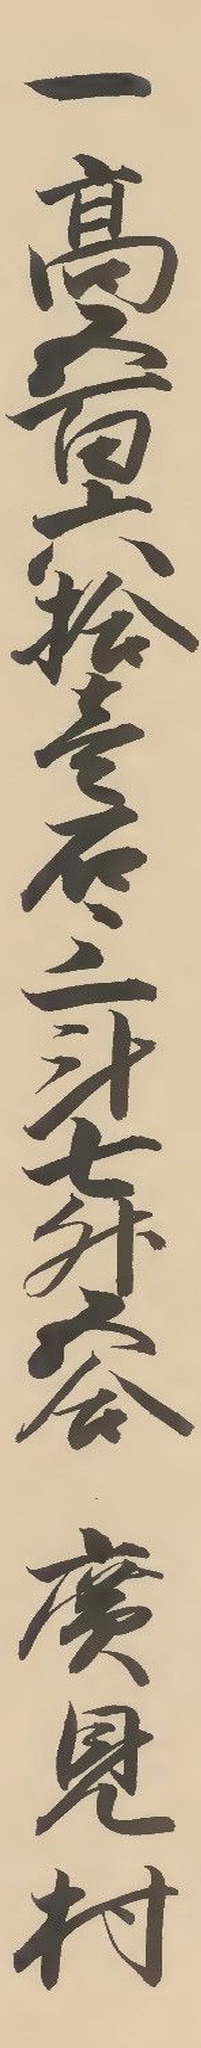一高五百六拾壱石三斗七升五合広見村
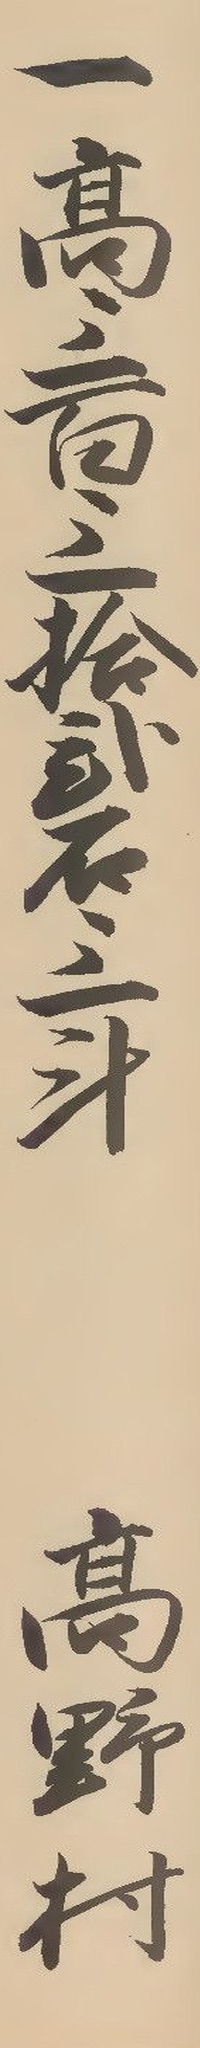一高三百三拾弐石三斗高野村
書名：美濃国郷帳
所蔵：国立公文書館 National Archives of Japan
